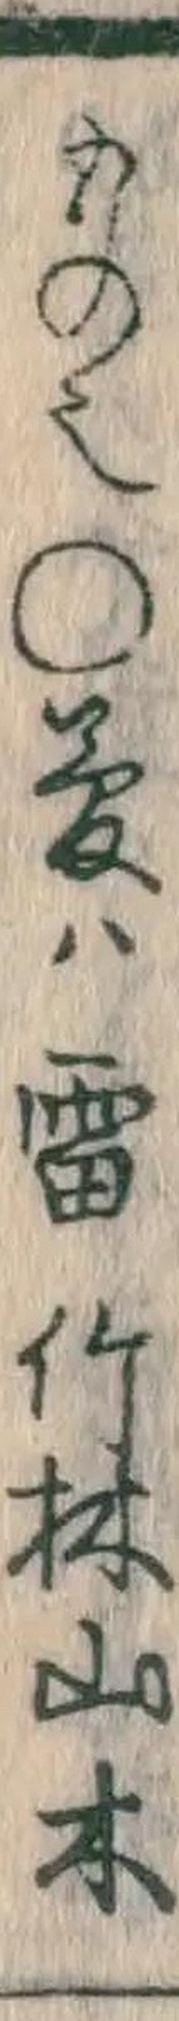もの也○夢は雷竹林山木
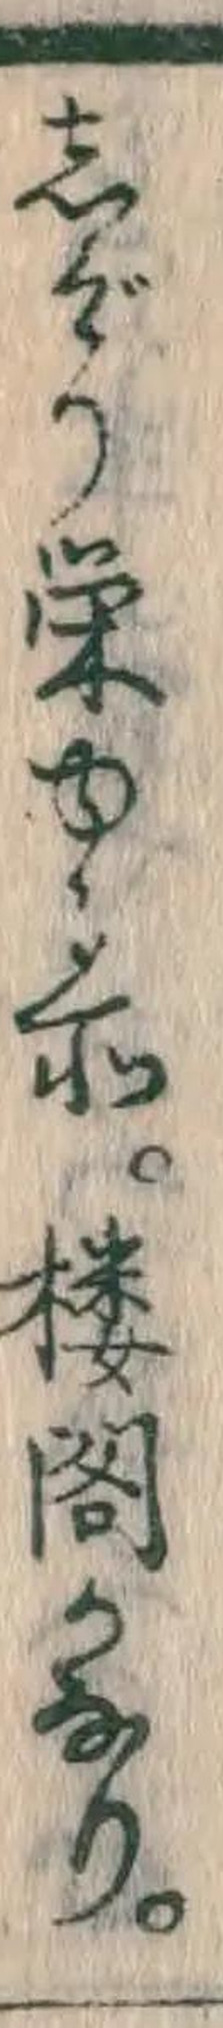しげり栄ゆる所。楼閣かなり。
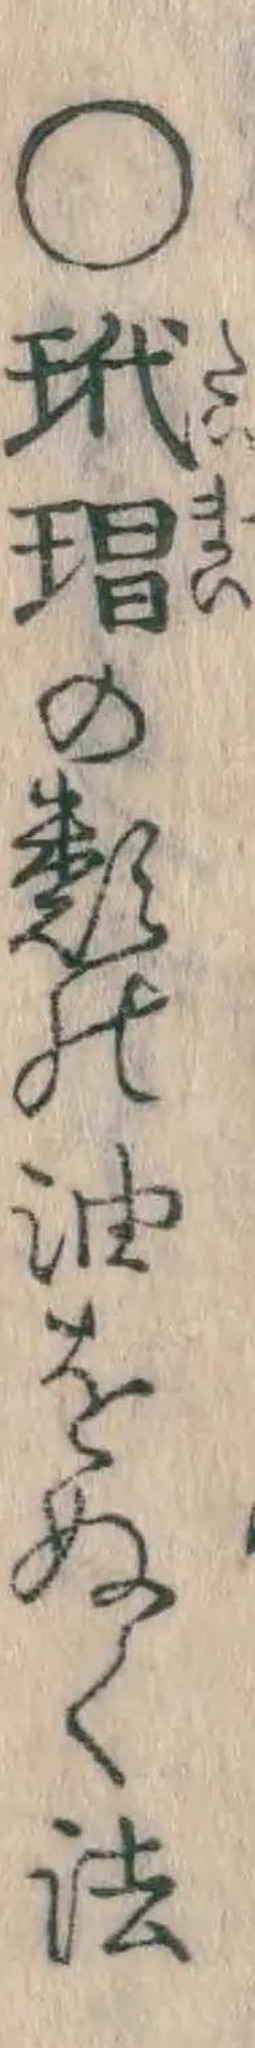○玳瑁の類の油をぬく法
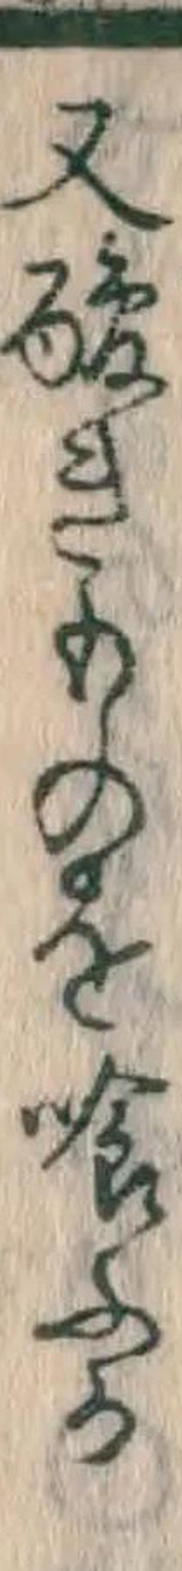又酸きものを喰ふか
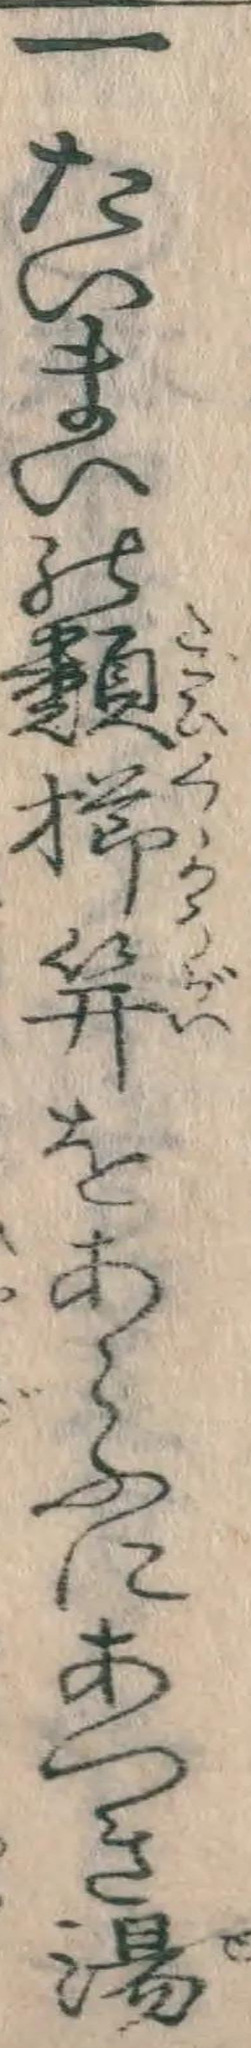一たいまいの類櫛笄をあらふにあつき湯
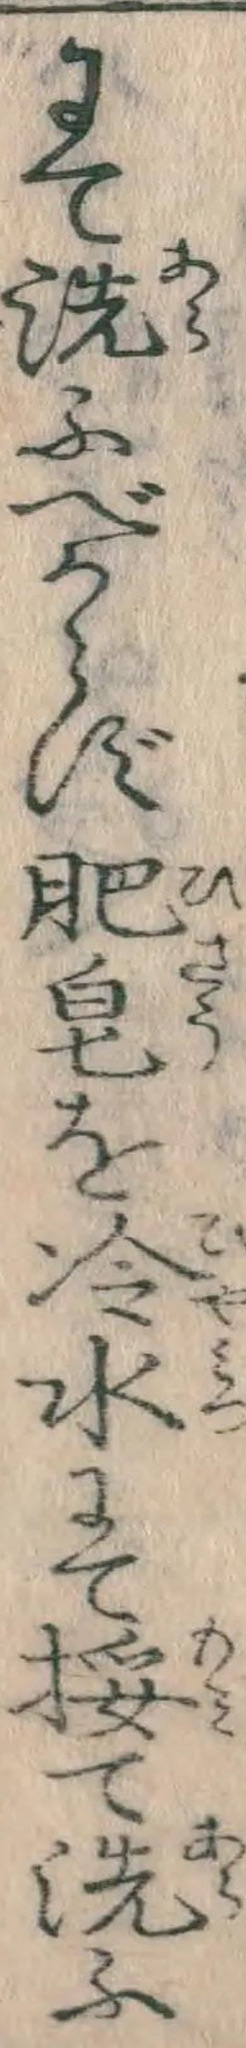にて洗ふべからず肥皁を冷水にて挼て洗ふ
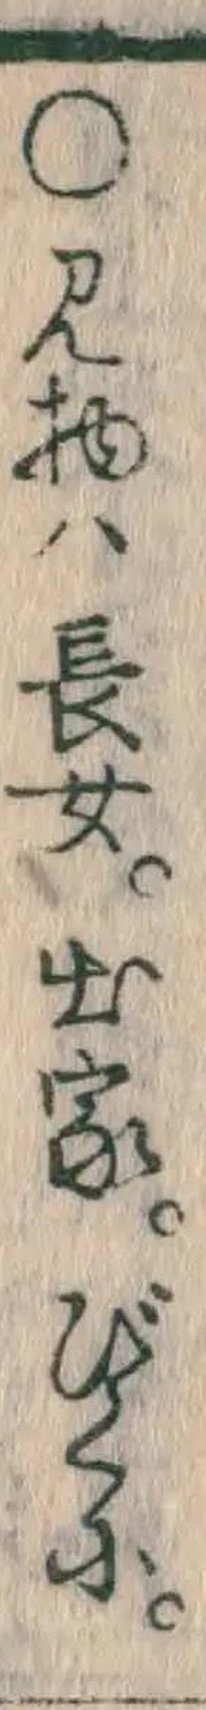○見物は長女。出家。びくに。
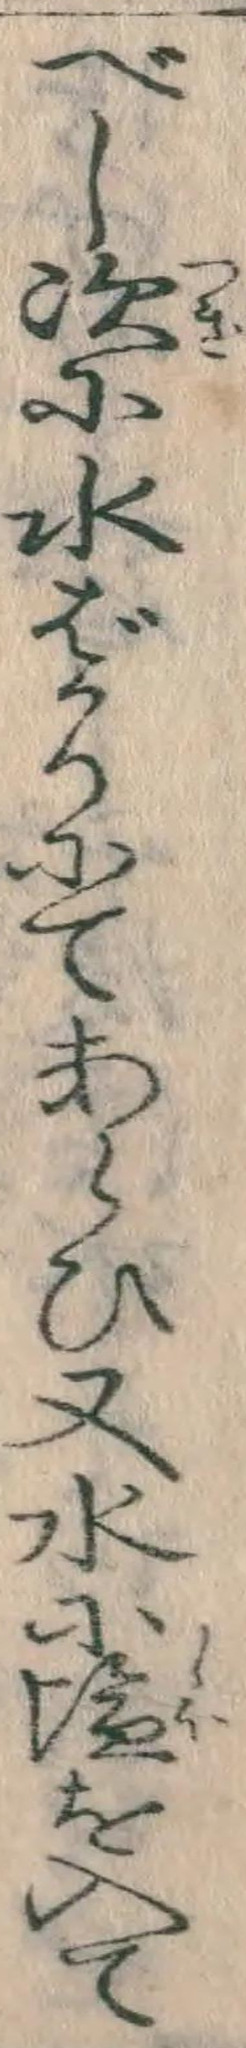べし次に水ばかりにてあらひ又水に塩を入て
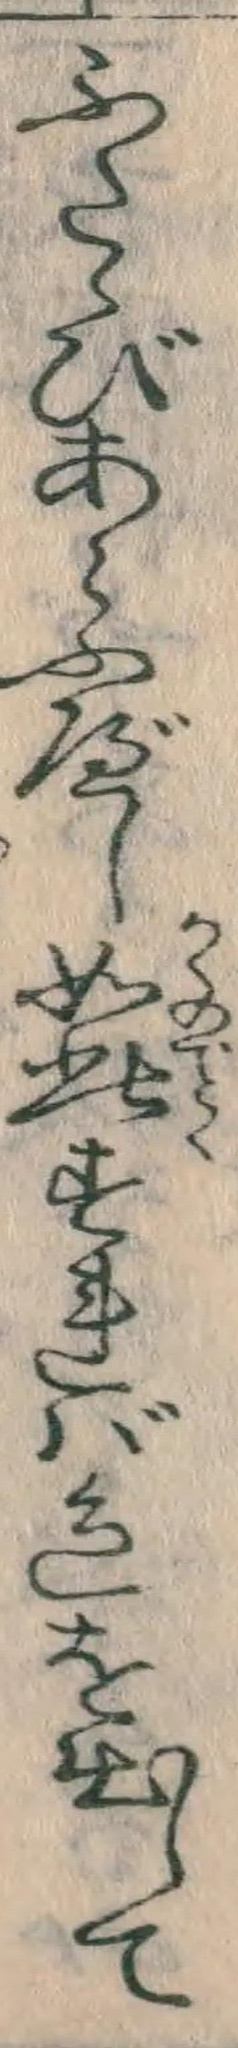ふたゝびあらふべし如此すれば色を出して
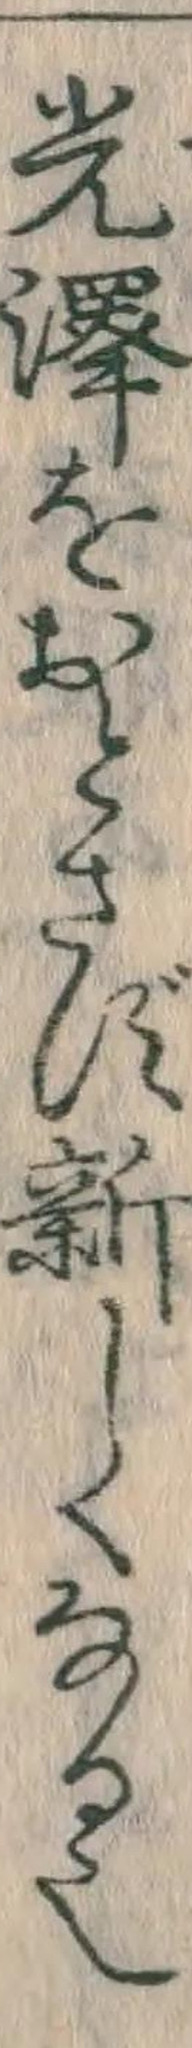光沢をおとさず新しくなる也
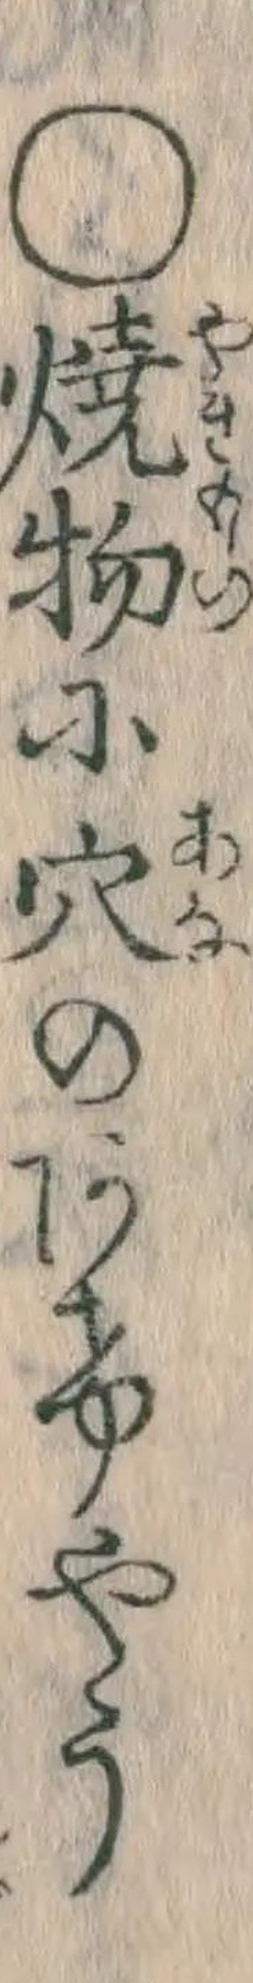○焼物に穴のあけやう
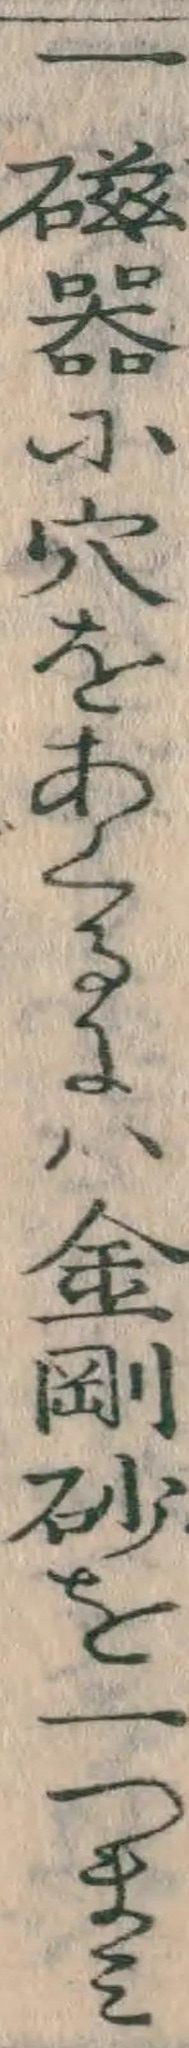一磁器に穴をあくるには金剛砂を一つまみ
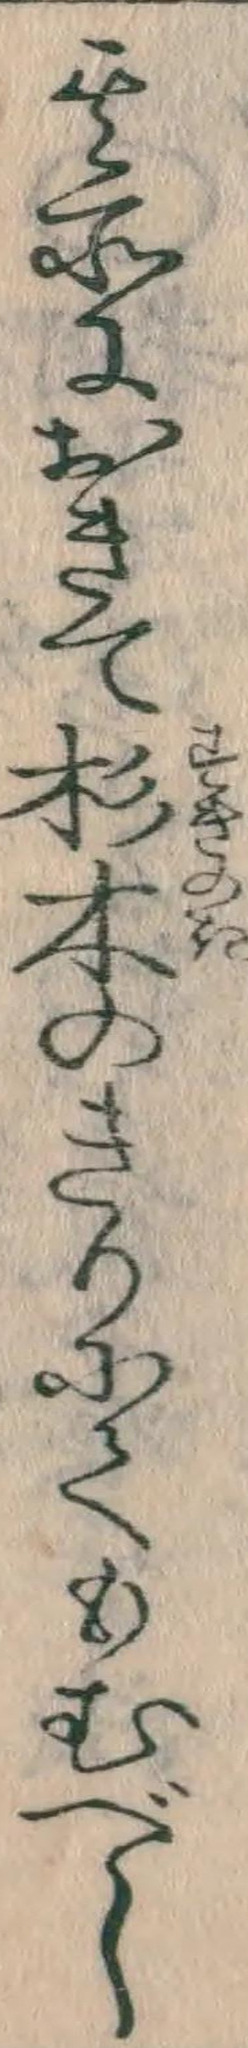其所におきて杉木のきりにてもむべし
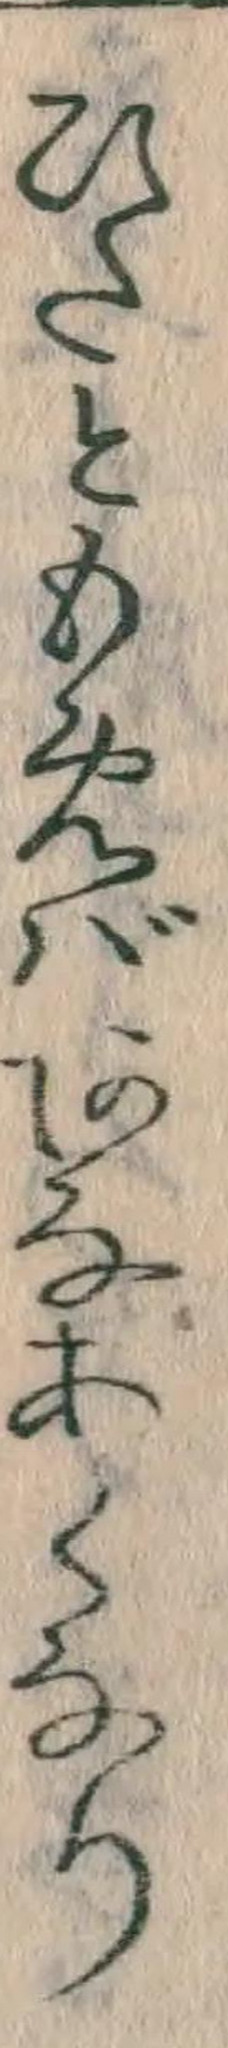ひたともめばあなあくなり
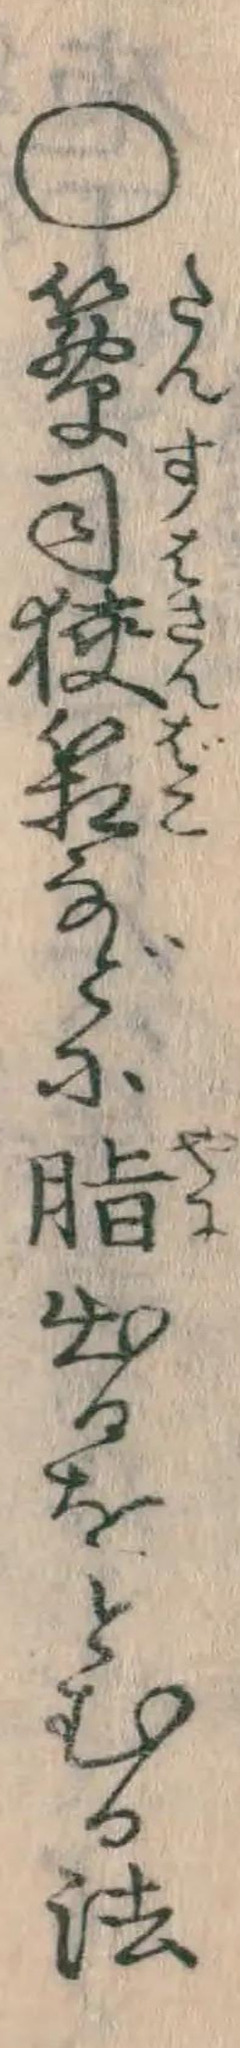○箪司挟箱などに脂出るをとむる法
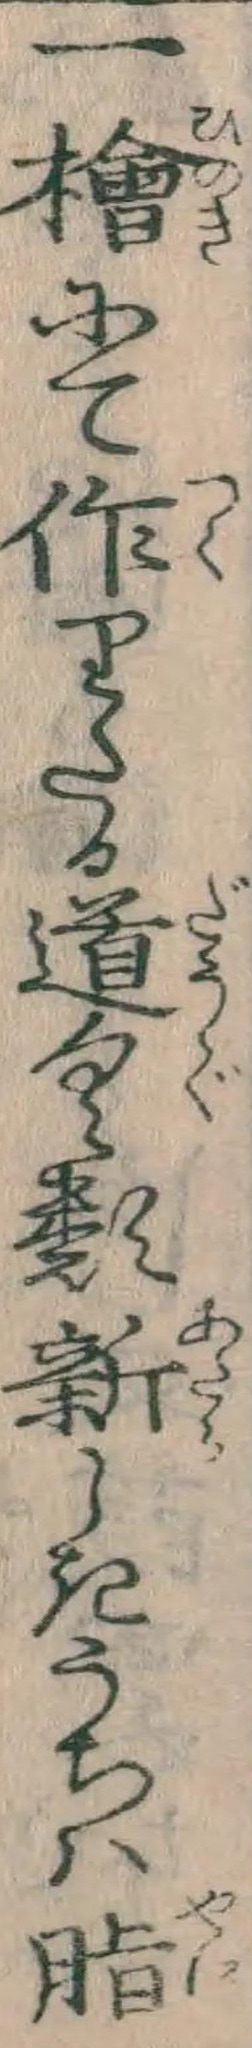一檜にて作りたる道具類新しきうちは脂
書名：広益秘事大全 3巻. [1]
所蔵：国立国会図書館 National Diet Library, JAPAN
